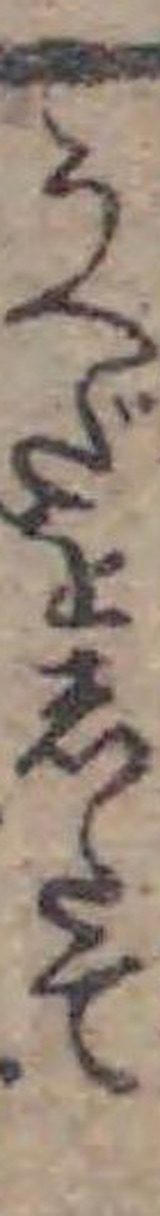うへだをしたて
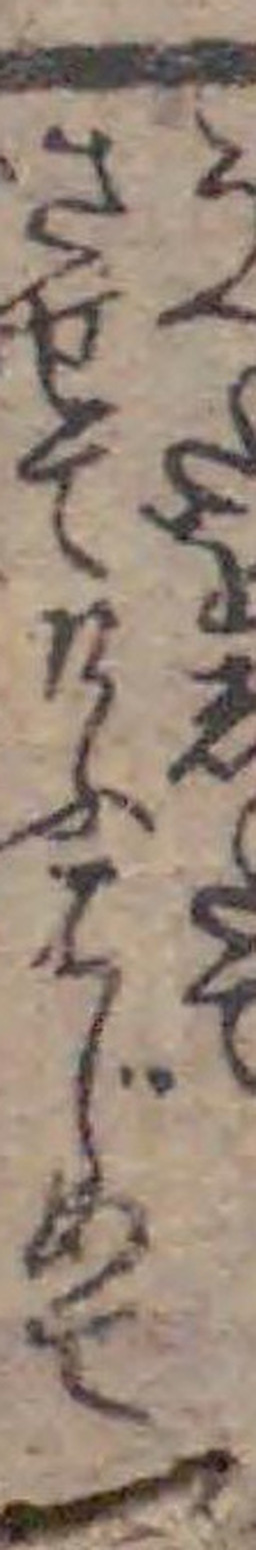させてけふはじめて
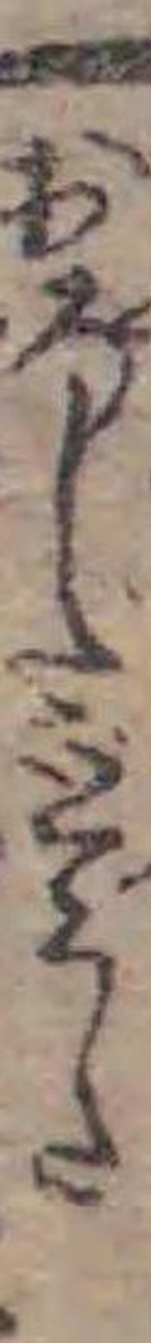おろしたとうた
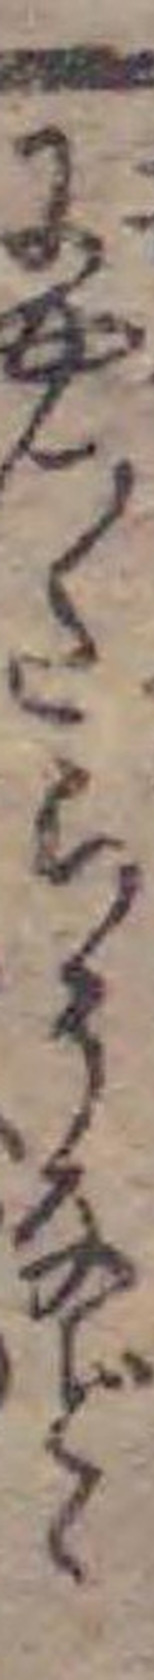にやつたらうなどゝ
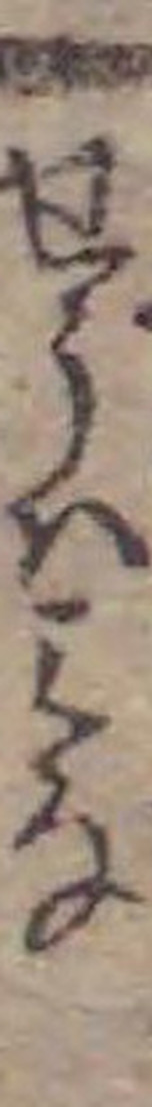せうはみな
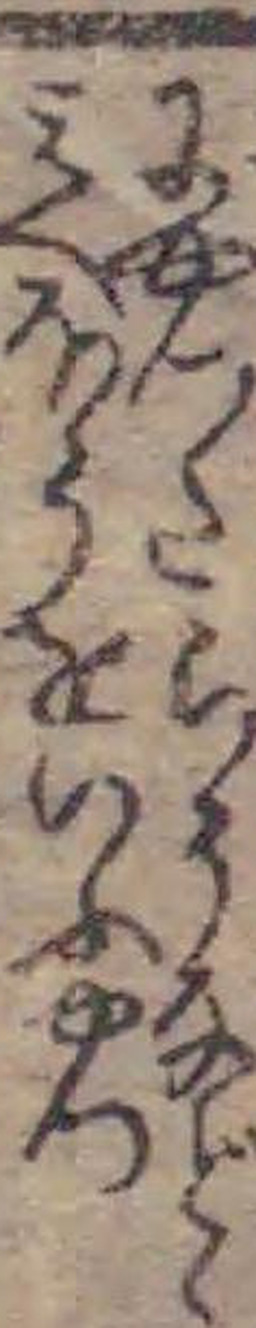みへほうをいふやつ
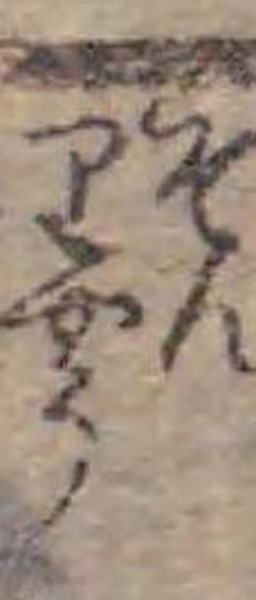りやう
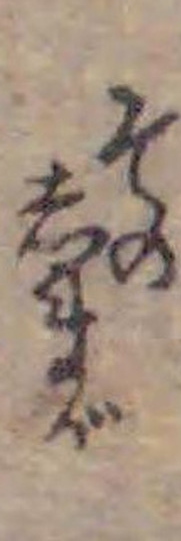しまが
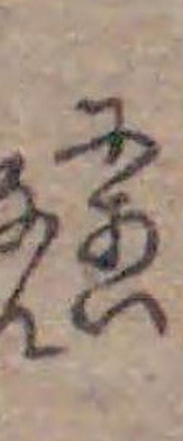にあい

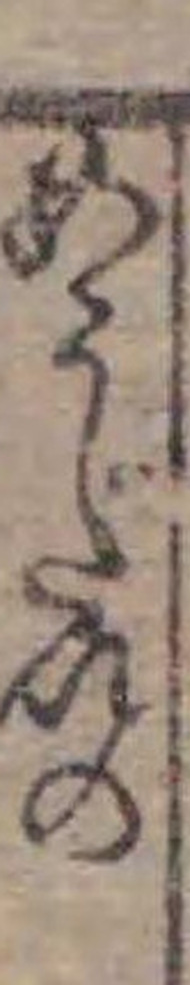めうだいの
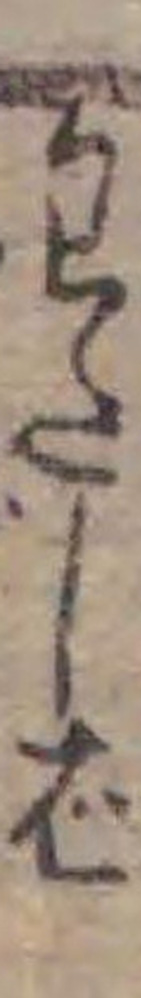わたしば
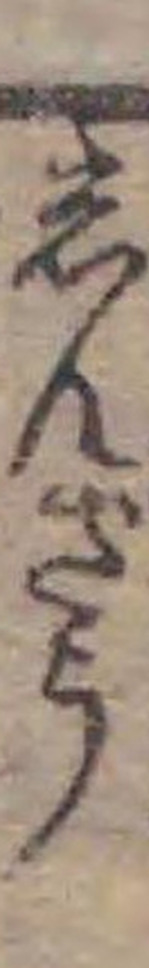しんざう
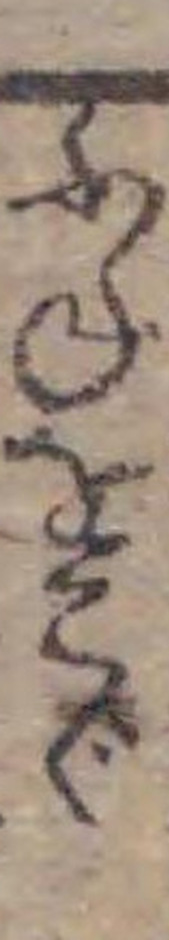ふねをこぐ
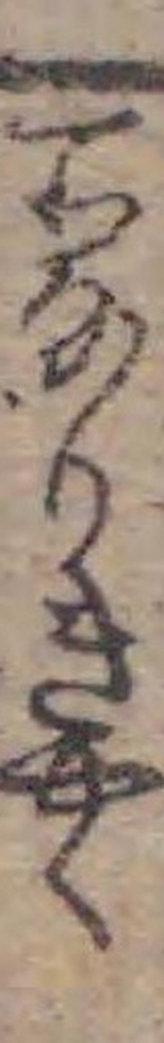所なりきやく
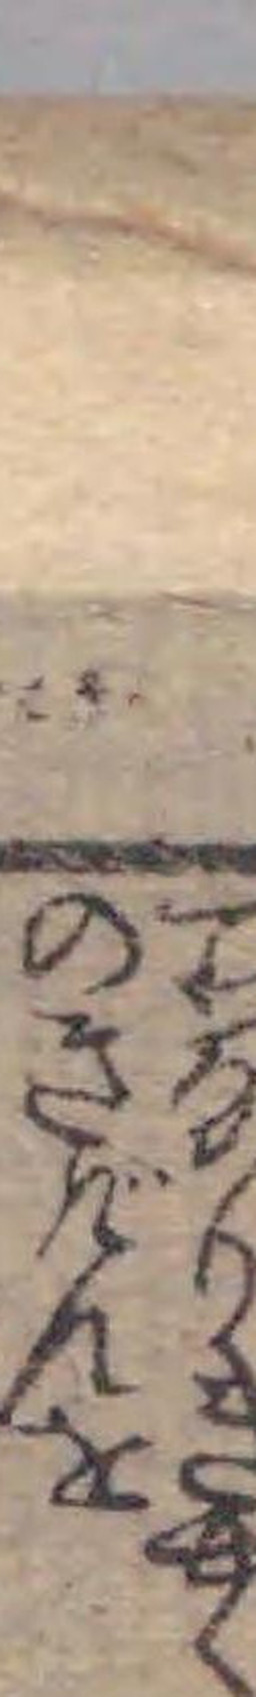のきげんを
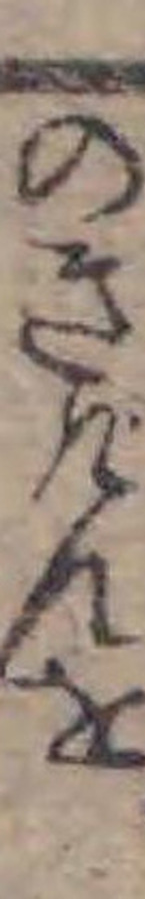のきげんを
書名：北国順礼唄方便 : 3巻
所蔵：国立国会図書館 National Diet Library, JAPAN
